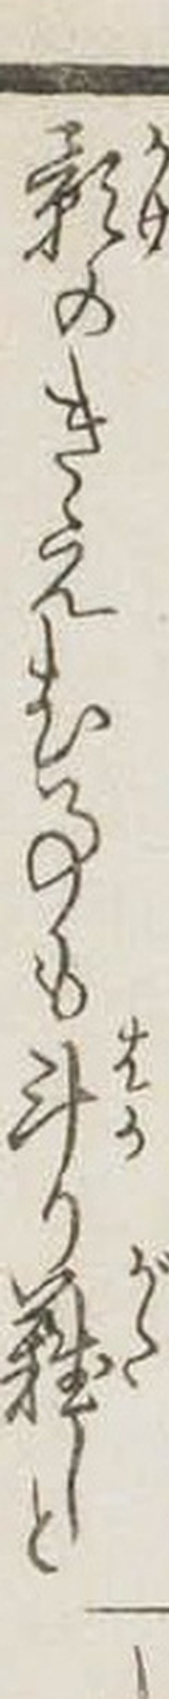影のきえむ事も計り難しと
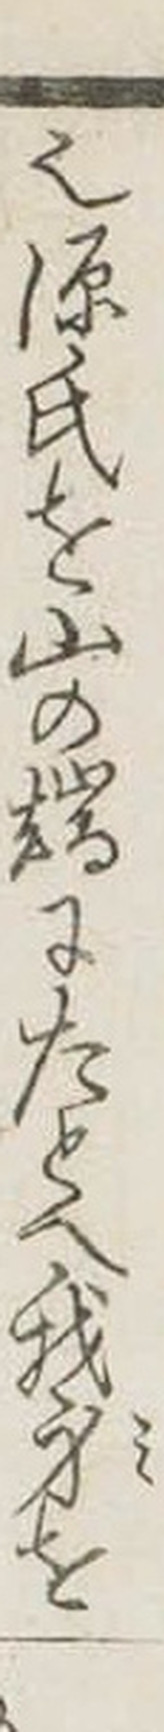也源氏を山の端にたとへ我身を
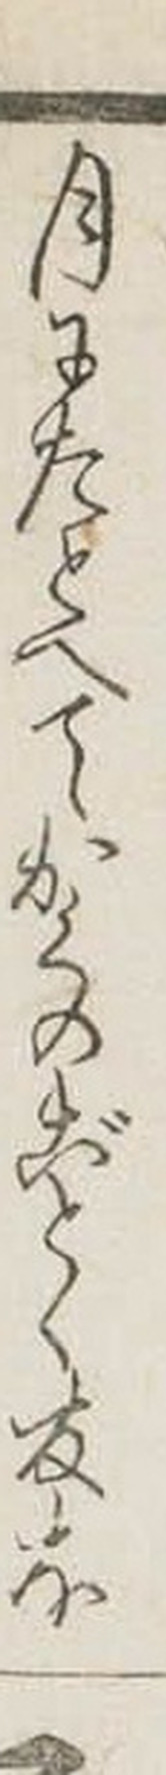月にたとへてかくのごとく友な
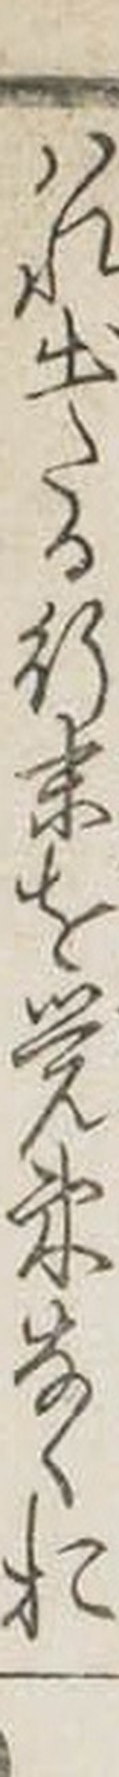はれ出たる行末を覚束なくお
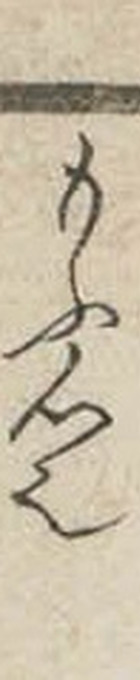もふ心也

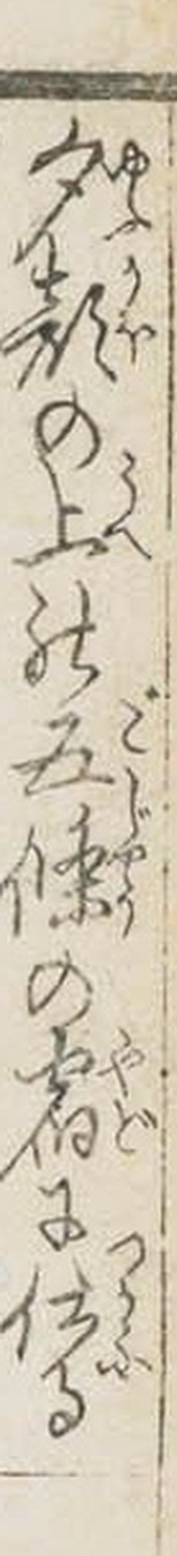夕顔の上の五条の宿に仕る
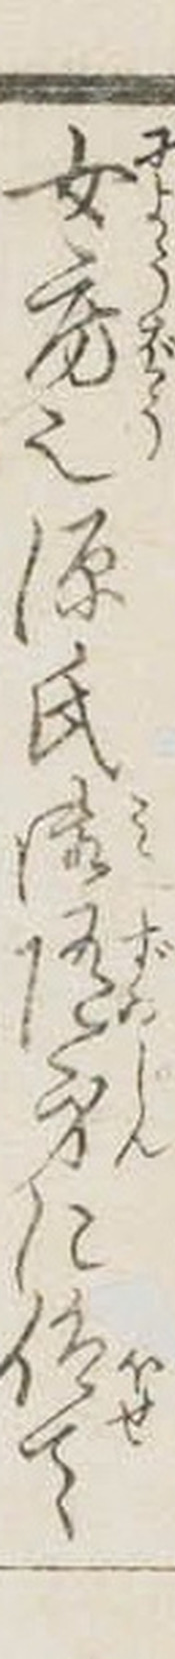女房也源氏御随身に仰て
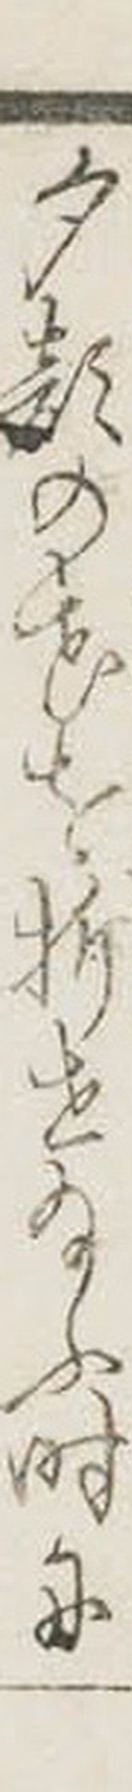夕顔の花を折せ給ふ時に
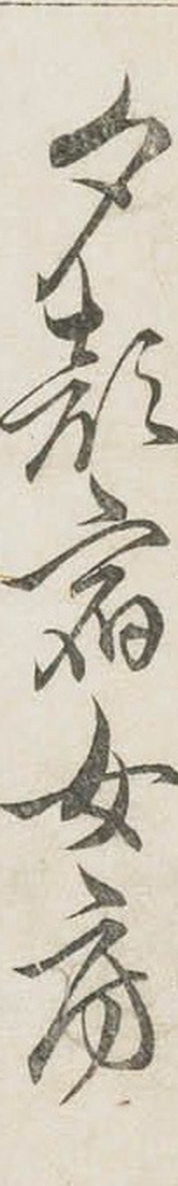夕顔宿女房
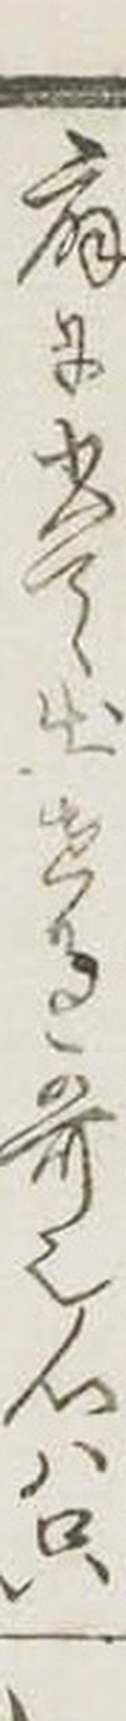扇に書て出せる哥也心は只
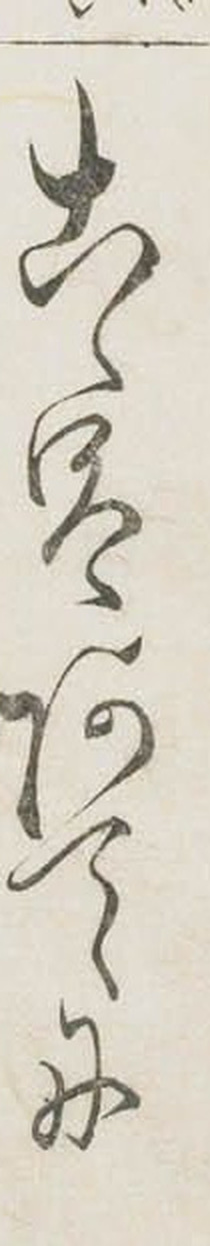こゝろあてに
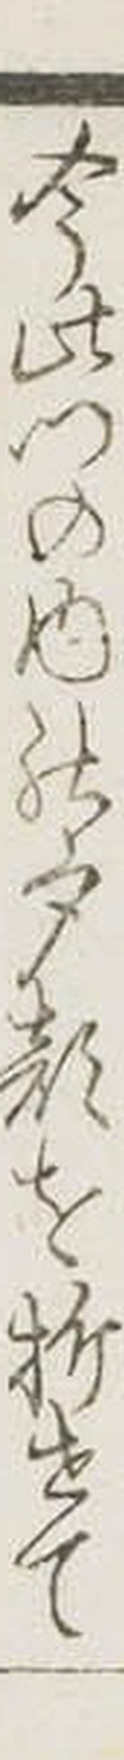今此門の内の夕顔を折せて
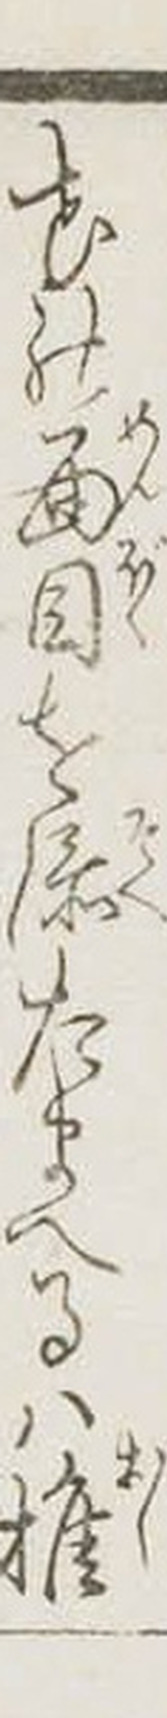花の面目を添たまへるは推
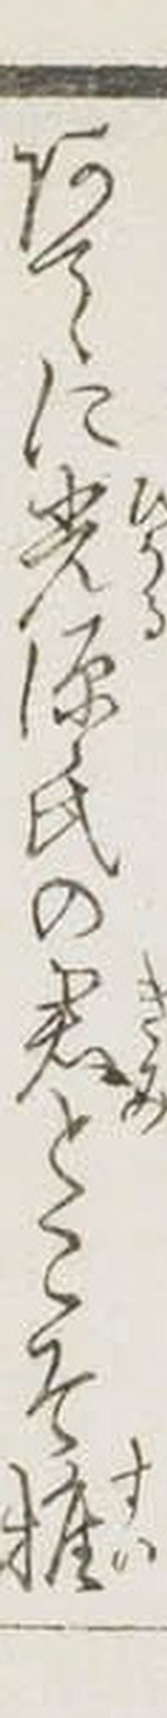あてに光源氏の君とこそ推
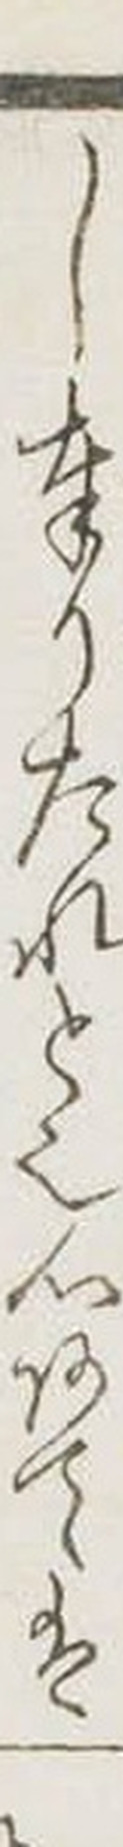し奉りたれと也心あては
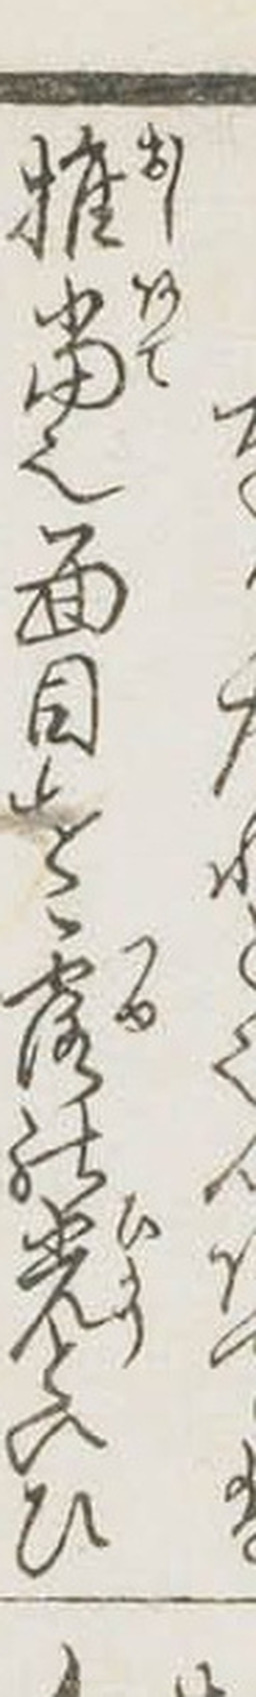推当也面目を露の光といひ
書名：源氏百人一首
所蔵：東京学芸大学教育コンテンツアーカイブ
